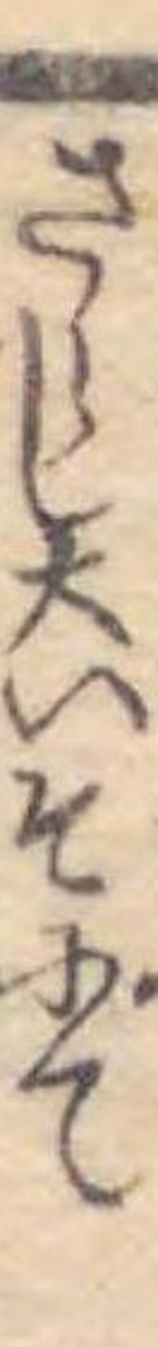さらし大いそにて
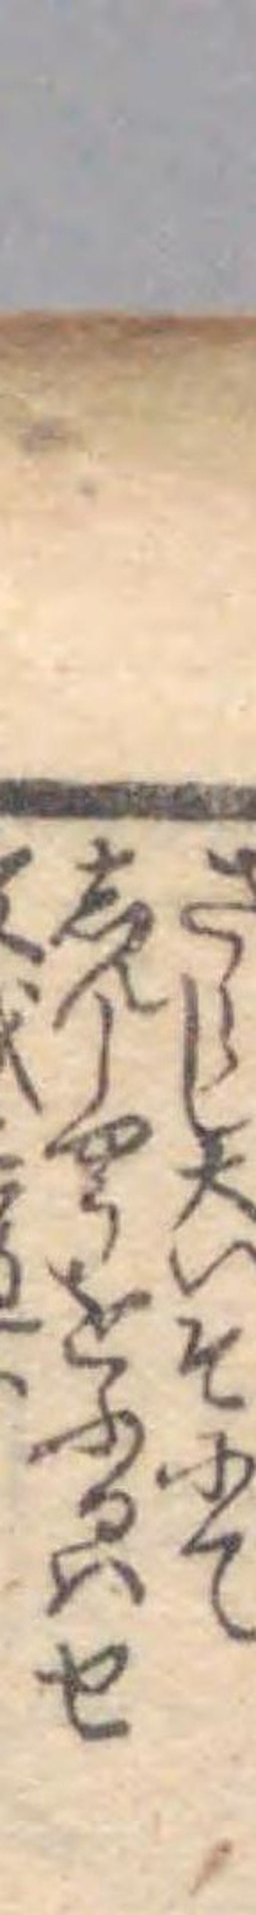しんしやうをふるはせ
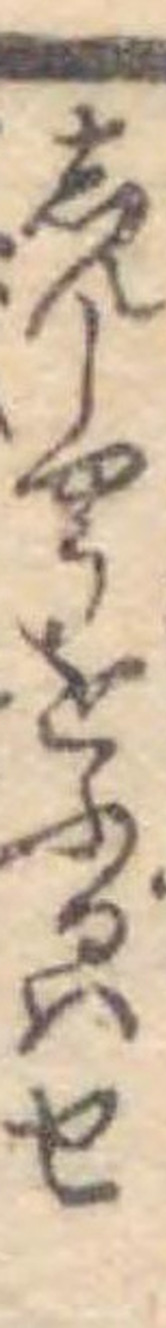しんしやうをふるはせ
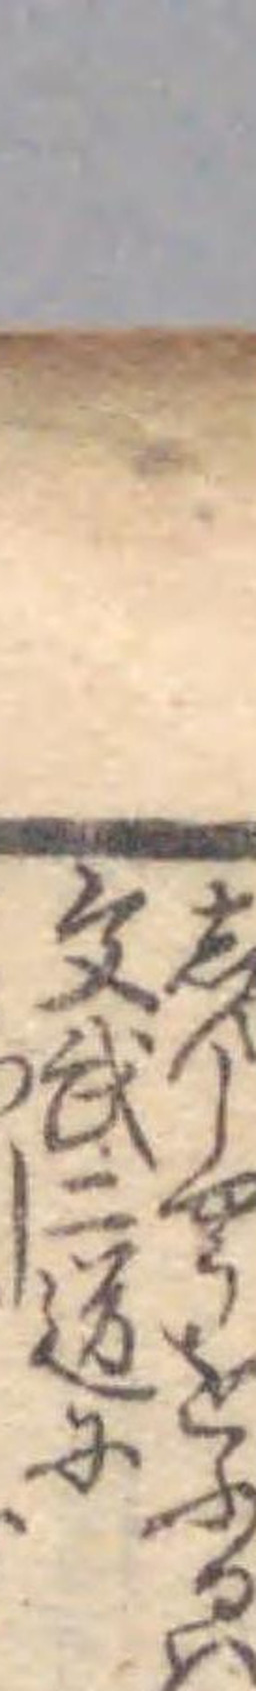文武二道に
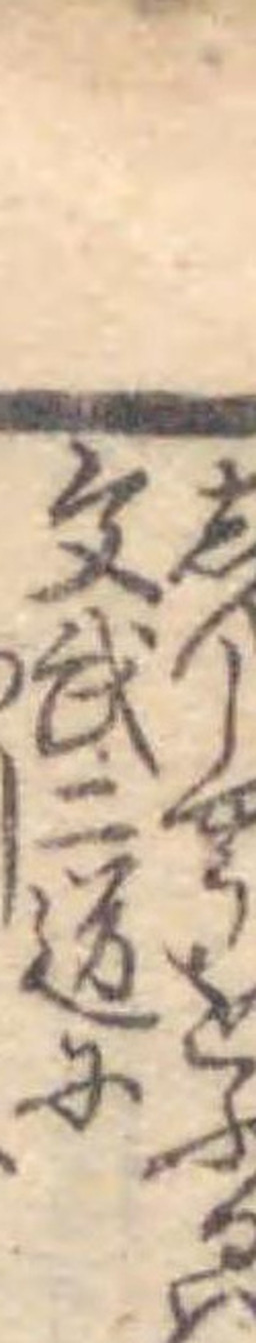文武二道に
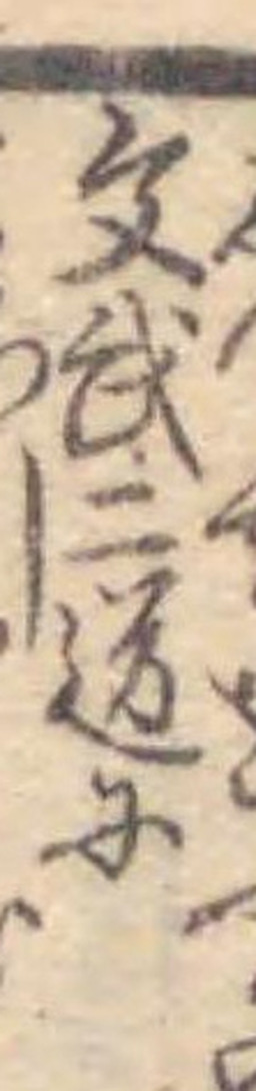文武二道に
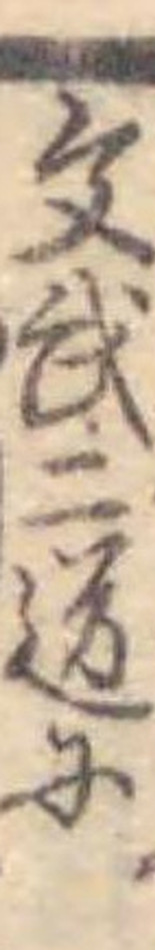文武二道に
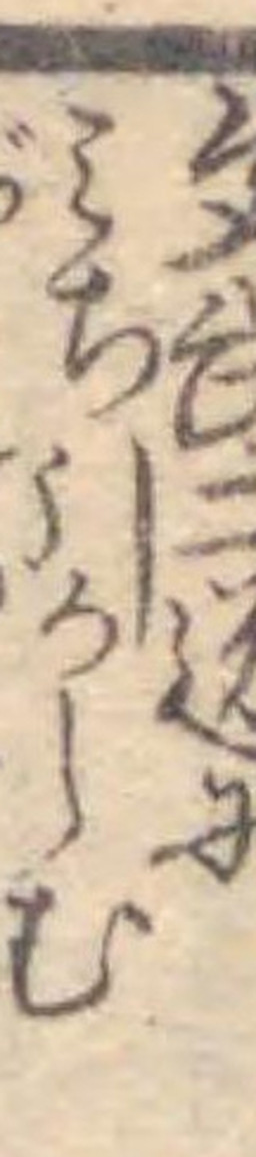みち引かしむ
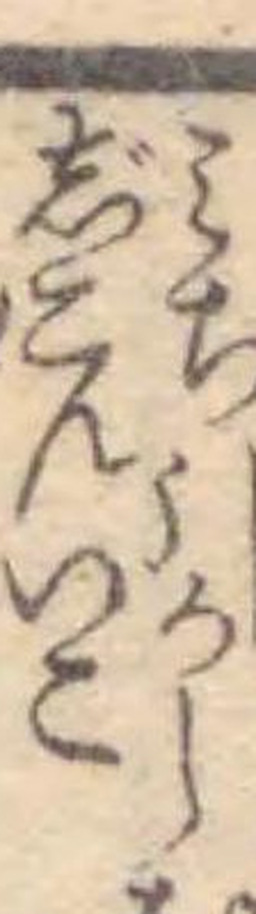じこんいこ
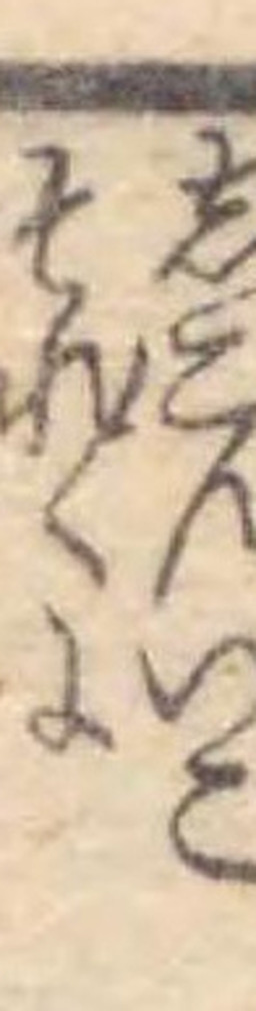それ〳〵に
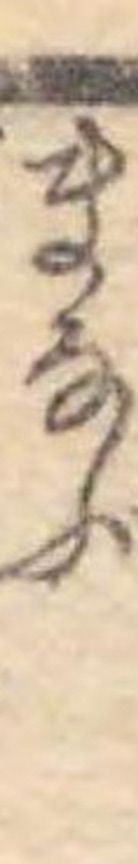まなぶ
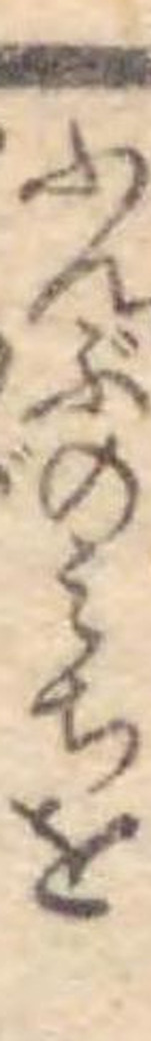ふんぶのみちを
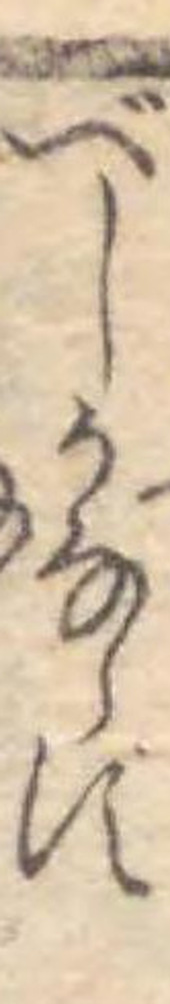べしかならず
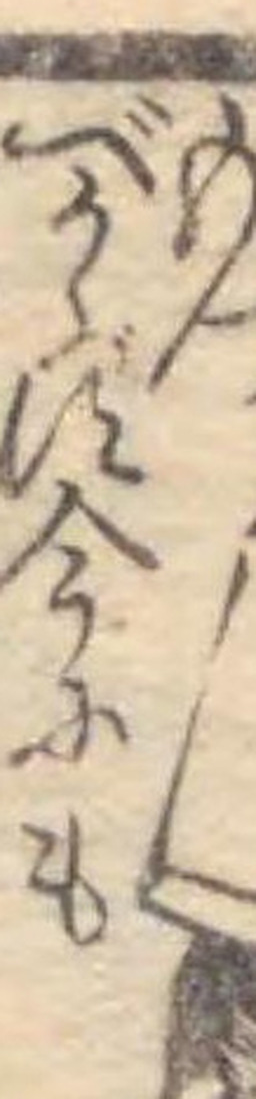べからず今にも
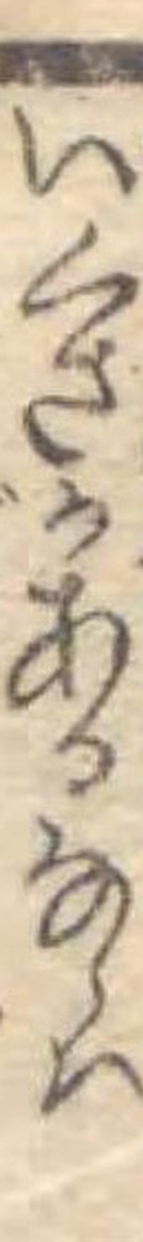いくさかあるならは
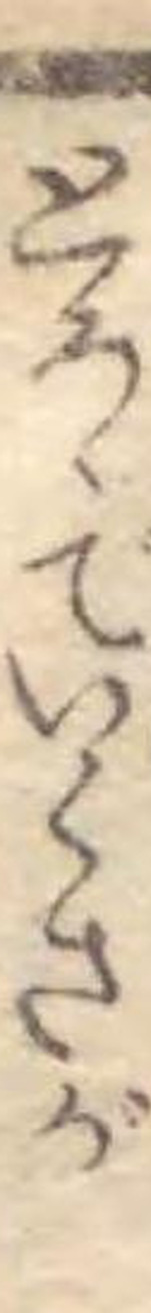とろゝでいくさが
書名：文武二道万石通 : 3巻
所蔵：国立国会図書館 National Diet Library, JAPAN
